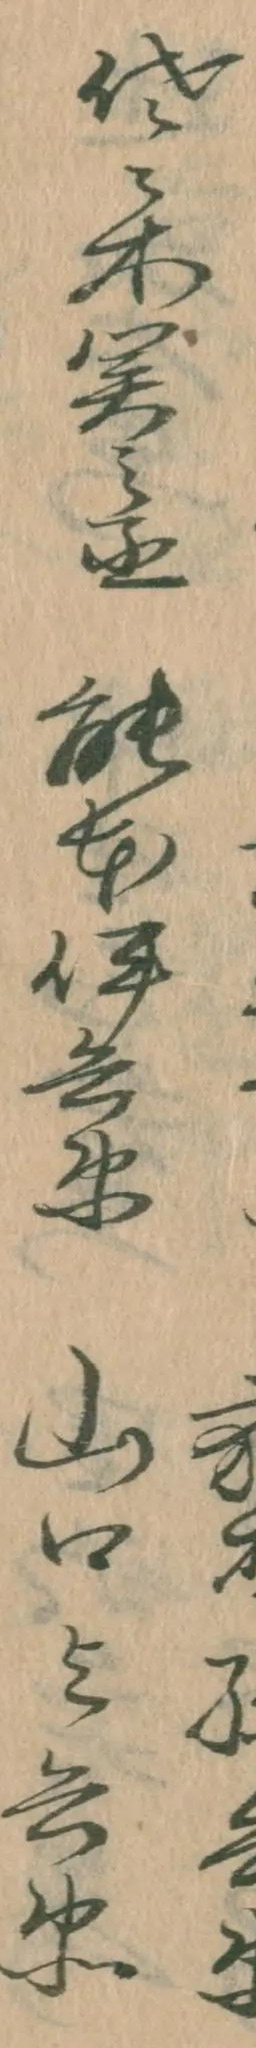佐々木関之丞能本伊兵衛山口与兵衛
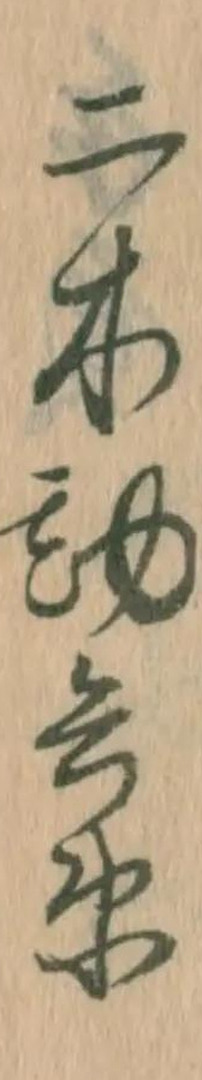高木小兵衛
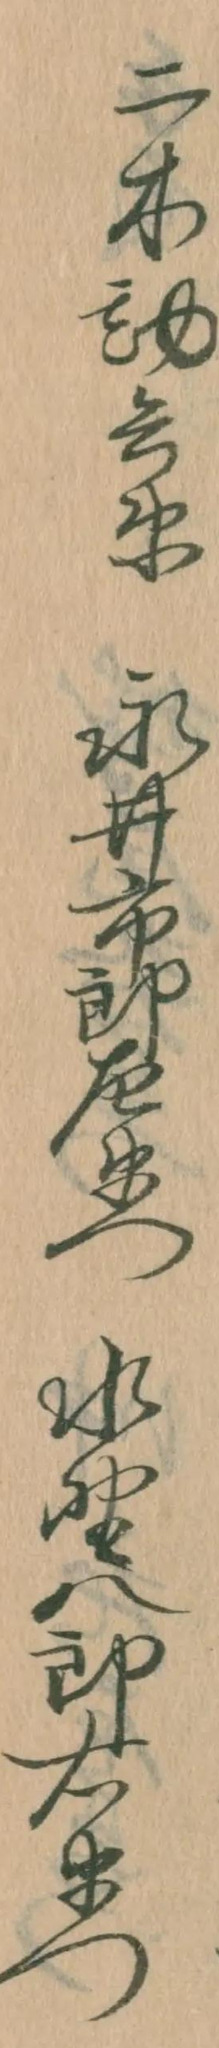二木勘兵衛永井市郎左衛門水野八郎右衛門
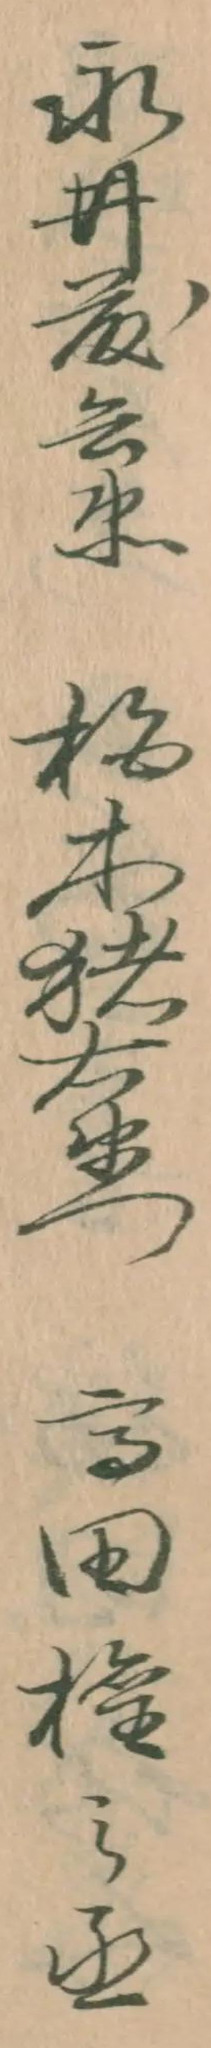永井藤兵衛梅木猪右衛門高田権之丞
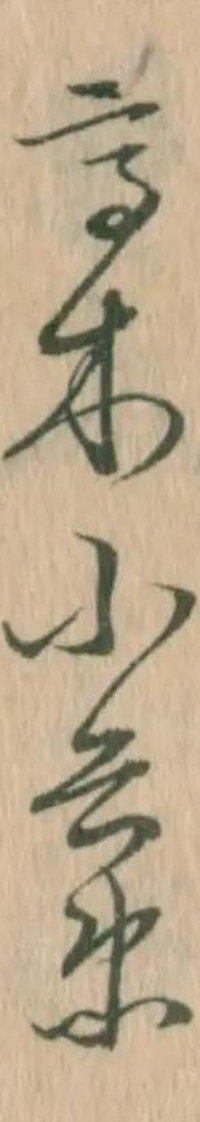高木小兵衛
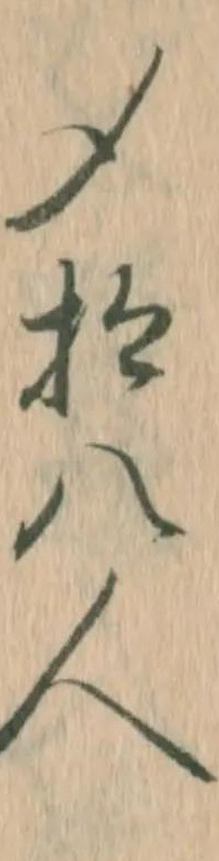〆拾八人
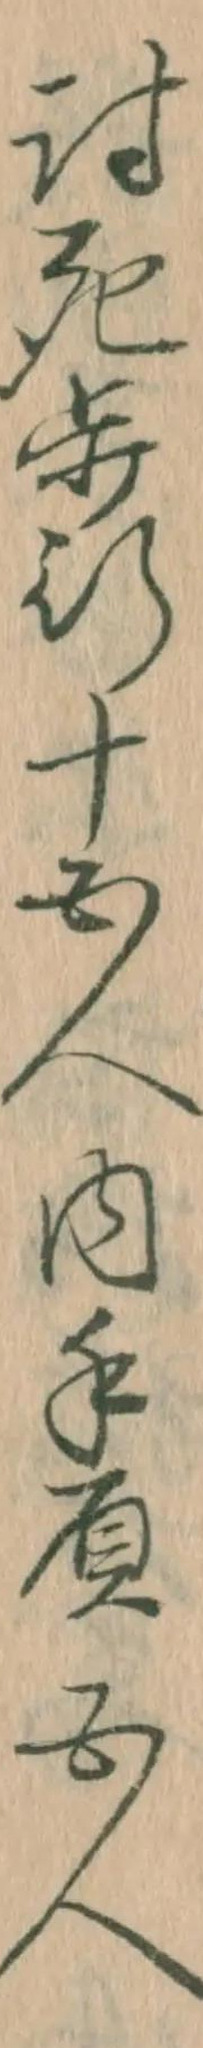内討死歩行十五人内手負五人
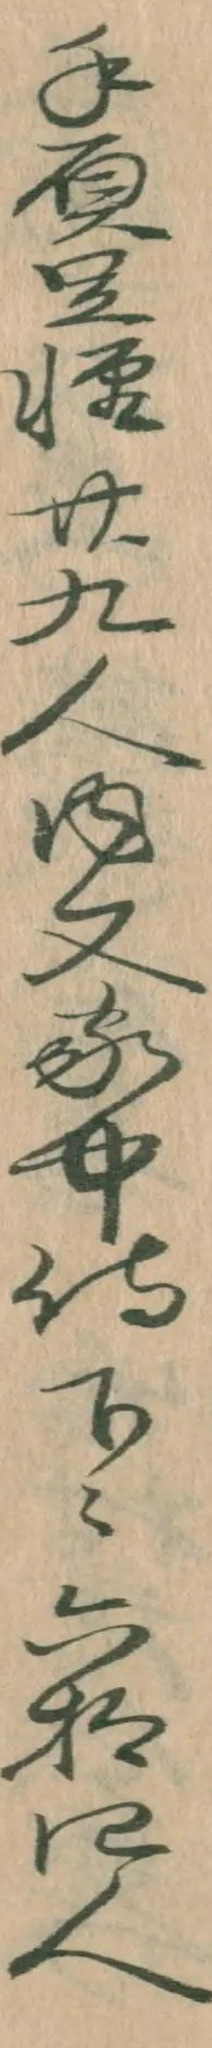手負足軽廿九人内又家中侍下々六拾四人
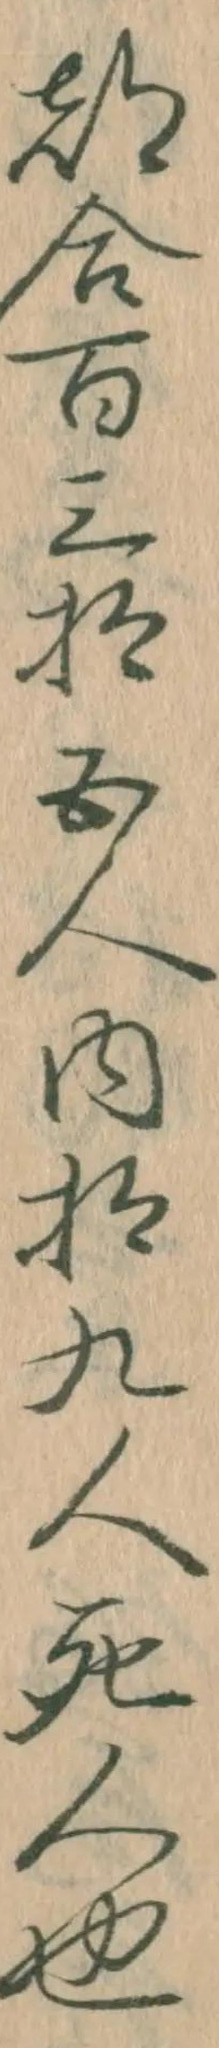都合百三拾五人内拾九人死人也
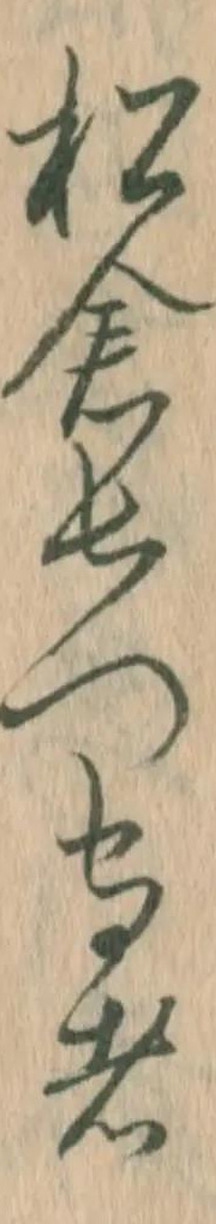松倉長門守者
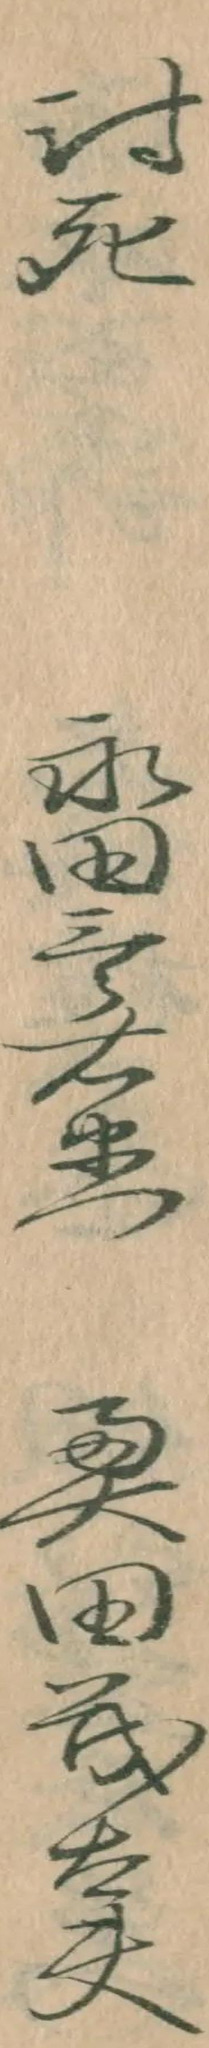討死永田三郎右衛門奥田茂太夫
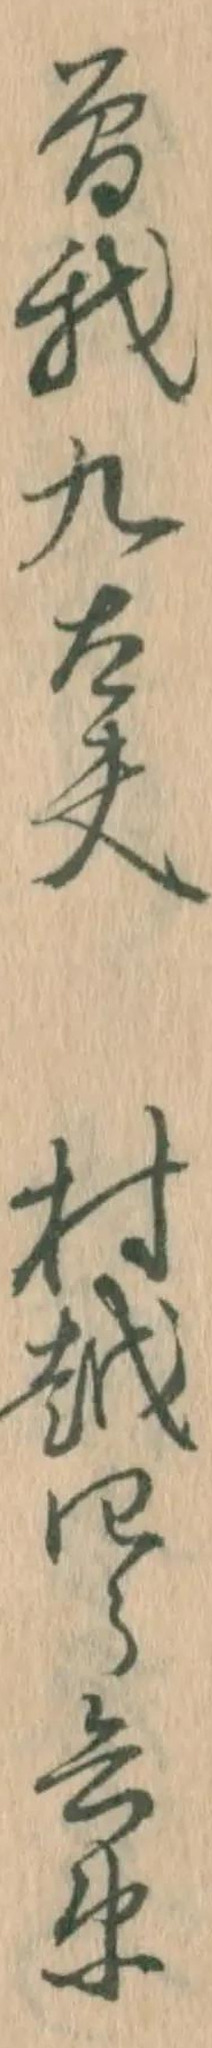曽我九太夫村越四郎兵衛
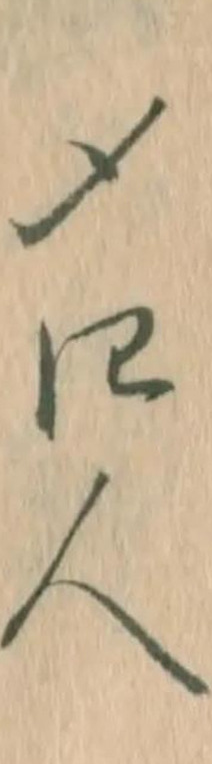〆四人

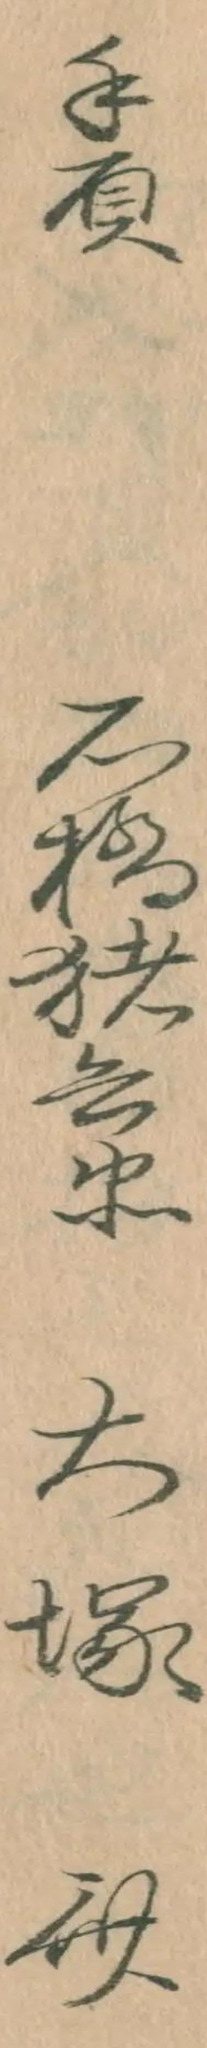手負石橋猪兵衛大塚斎
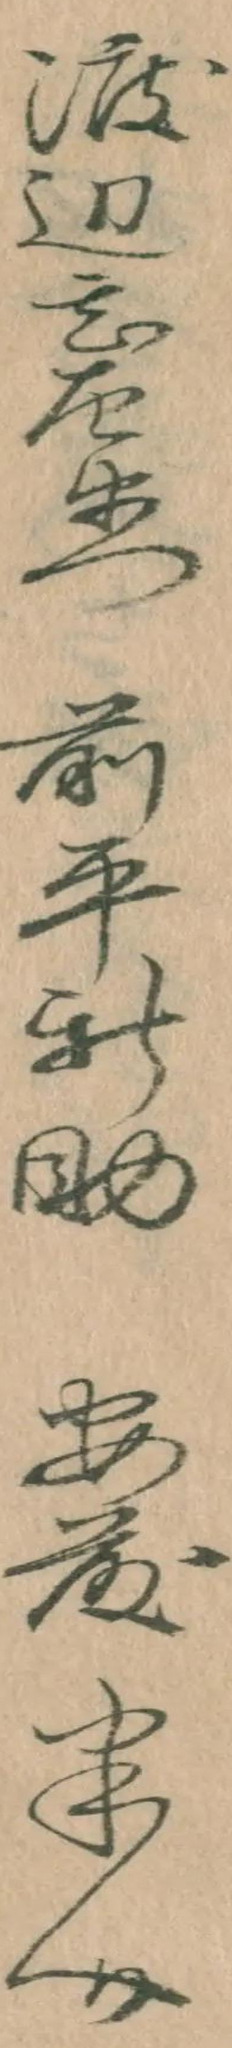渡辺甚左衛門前平新助安藤半介
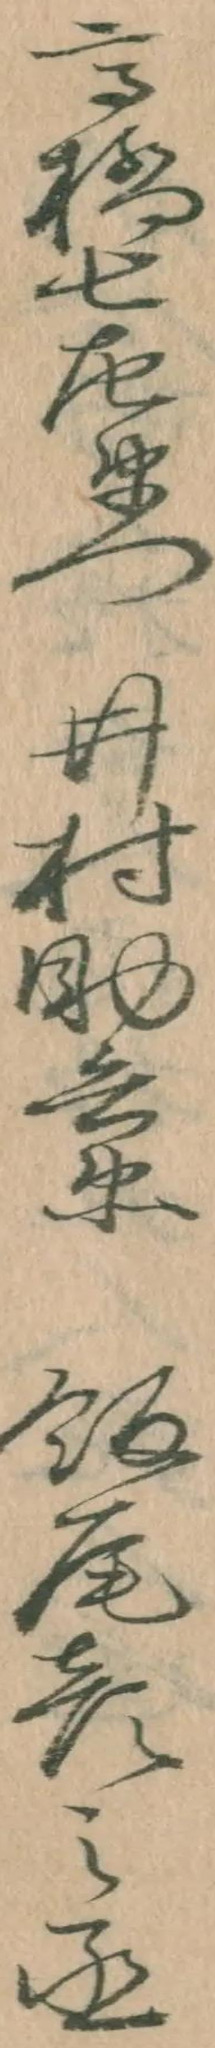高橋七左衛門井村助兵衛飯尾彦之丞
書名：切支丹御退治記 49巻. [9]
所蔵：国立国会図書館 National Diet Library, JAPAN
